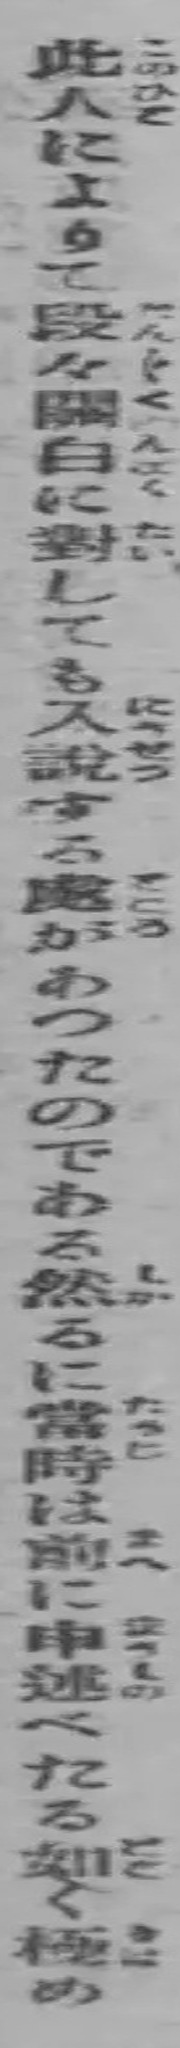此人によりて段々関白に対しても入説する処があつたのである然るに当時は前に申述べたる如く極め

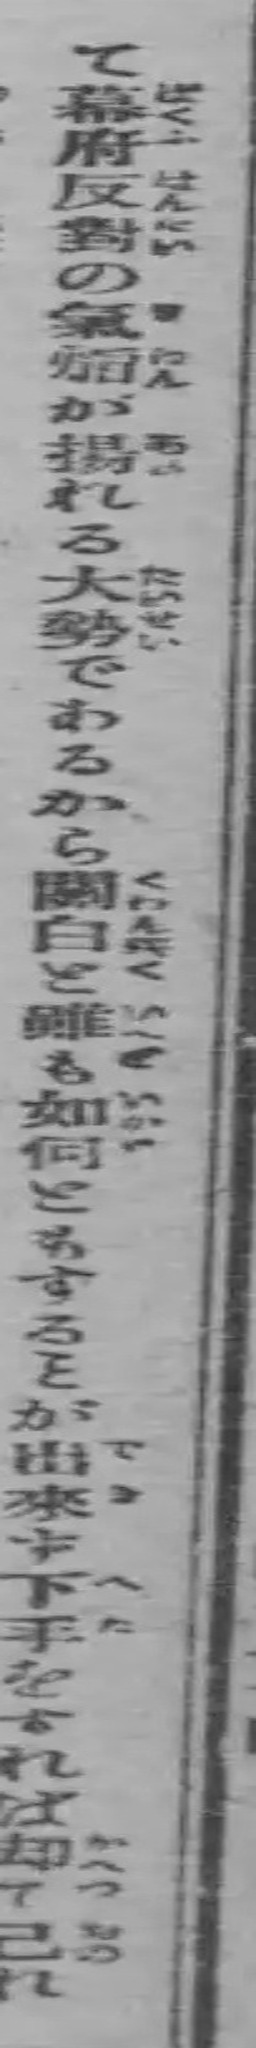て幕府反対の気焔が揚れる大勢であるから関白と雖も如何ともすることが出来ず下手をすれば却て己れ
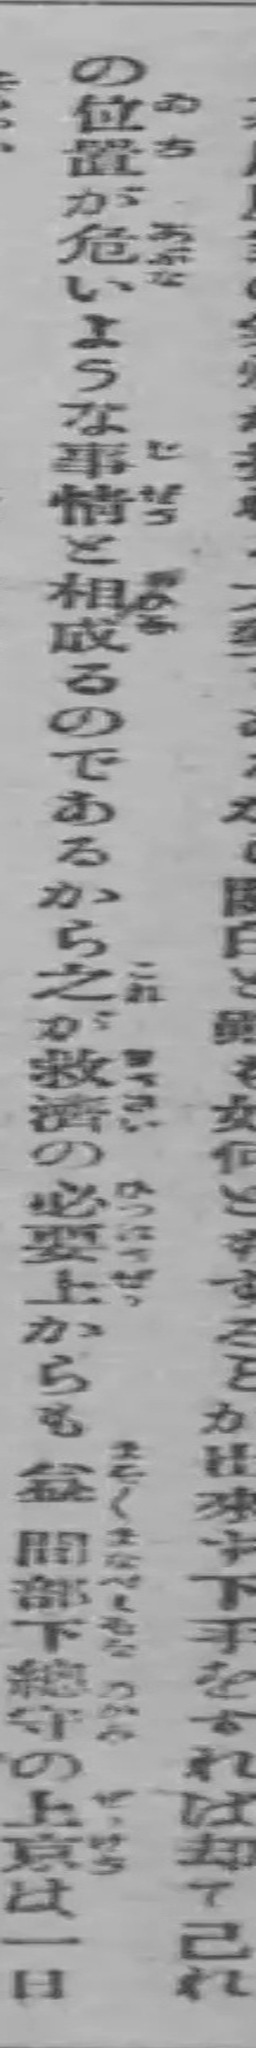の位置が危いような事情と相成るのであるから之が救済の必要上からも益間部下総守の上京は一日
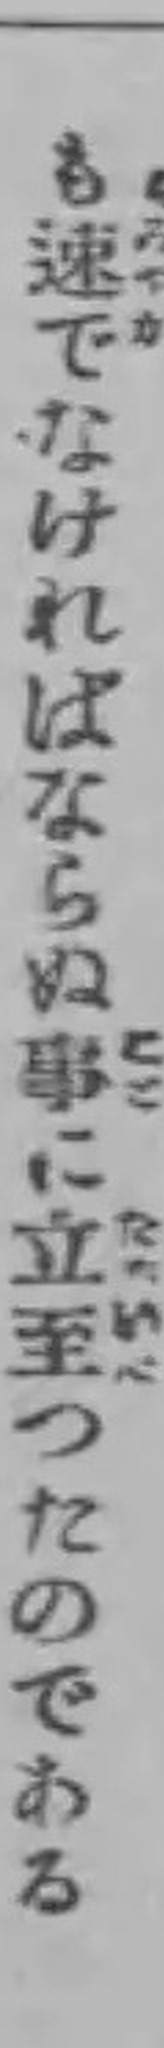も速でなければならぬ事に立至つたのである
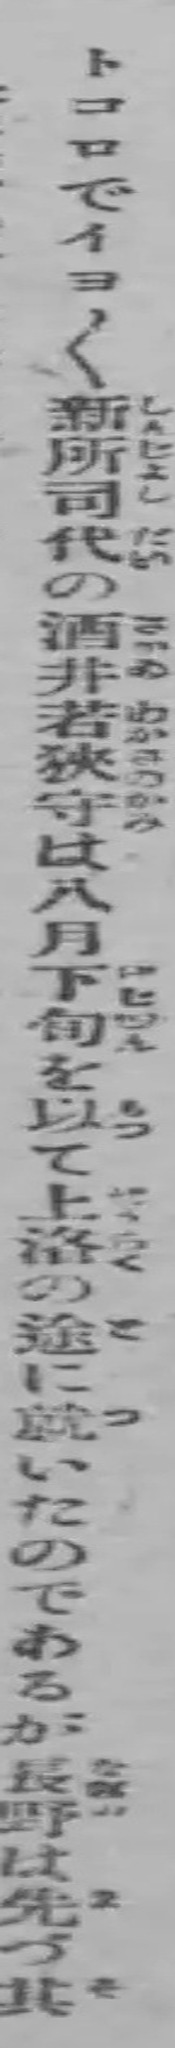トコロでイヨ〳〵新所司代の酒井若狭守は八月下旬を以て上洛の途に就いたのであるが長野は先づ其
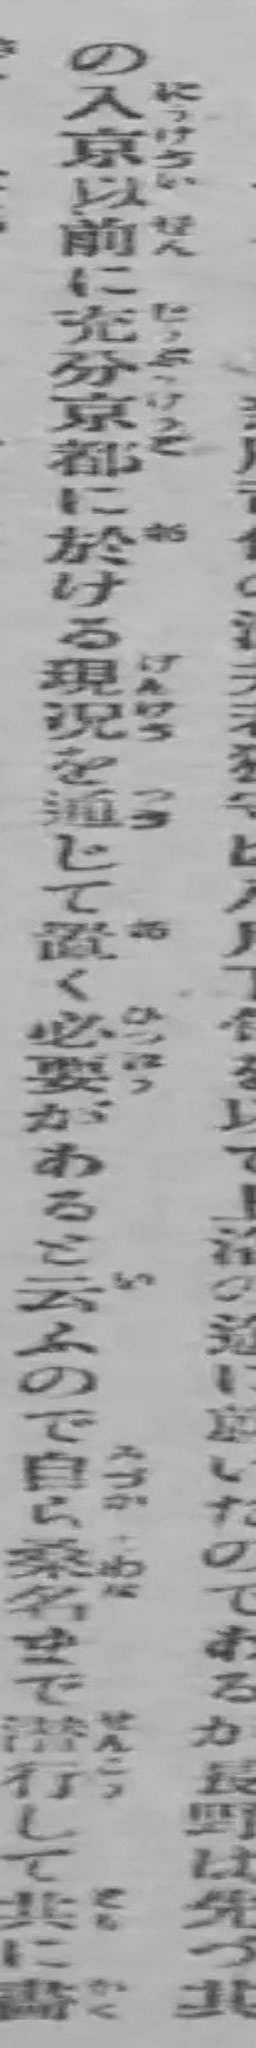の入京以前に充分京都に於ける現況を通じて置く必要があると云ふので自ら桑名まで潜行して共に画
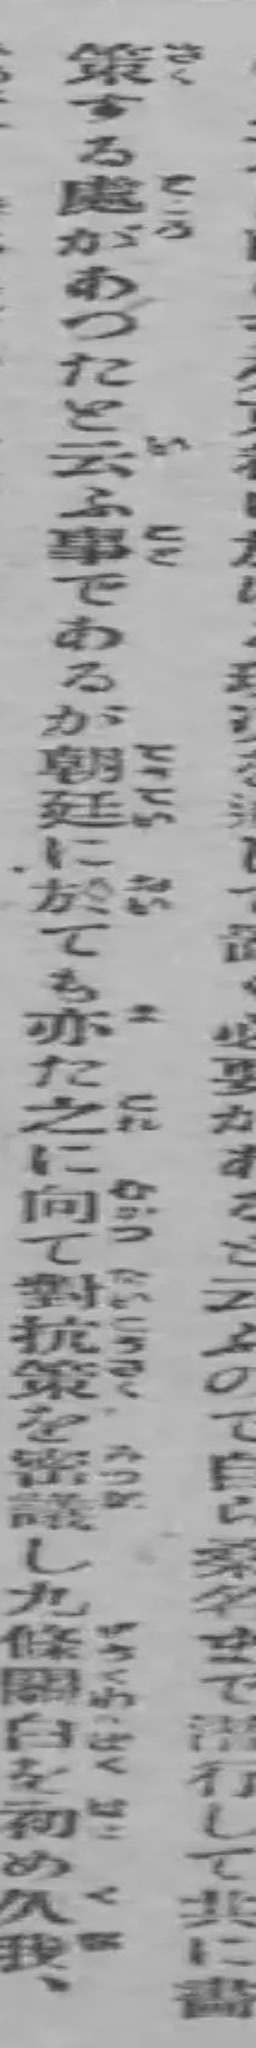策する処があつたと云ふ事であるが朝廷に於ても亦た之に向て対抗策を密議し九条関白を初め久我、
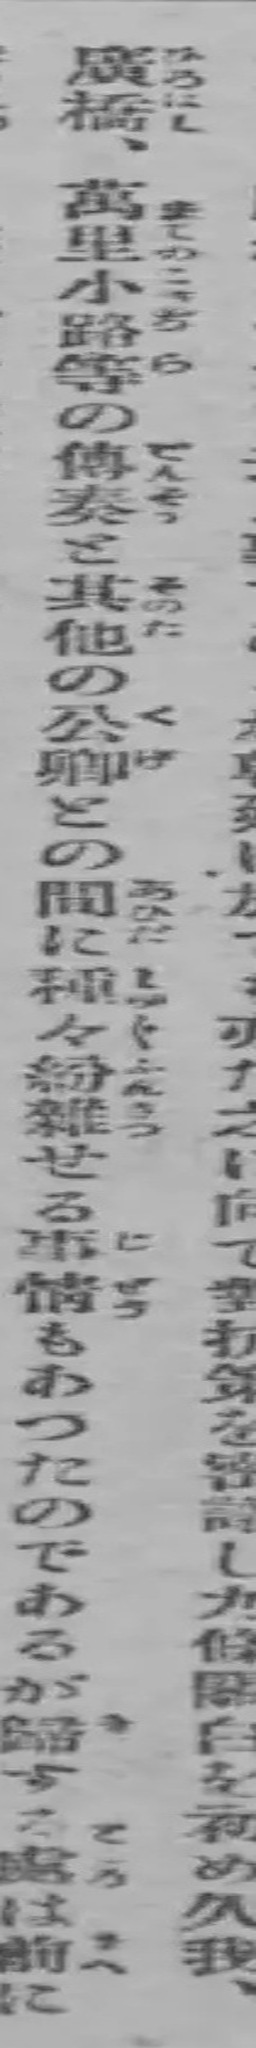廣橋、萬里小路等の伝奏と其他の公卿との間に種々紛雑せる事情もあつたのであるが帰する処は前に
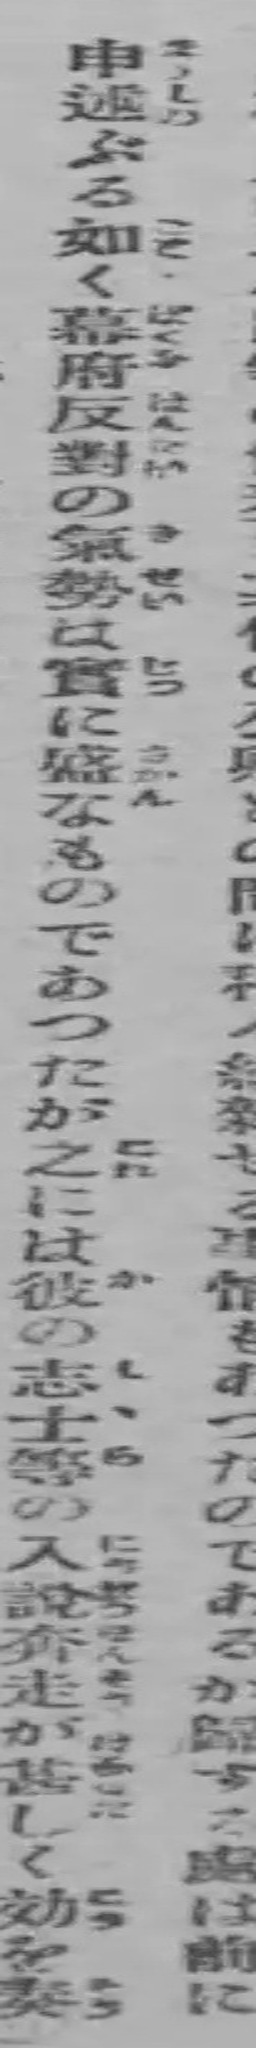申述ぶる如く幕府反対の気勢は実に盛なものであつたが之には彼の志士等の入説奔走が甚しく効を奏
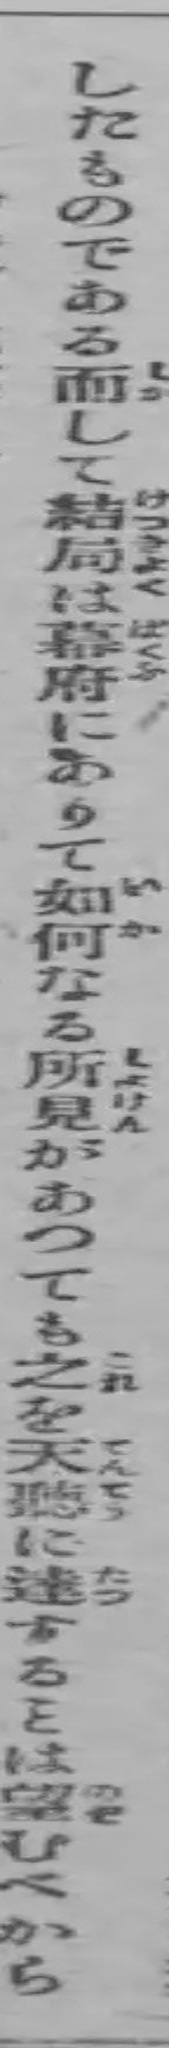したものである而して結局は幕府にありて如何なる所見があつても之を天聴に達することは望むべから
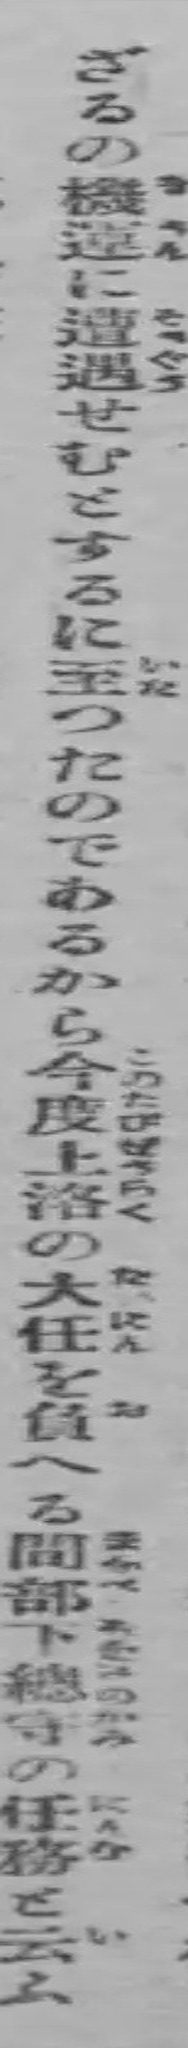ざるの気運に遭遇せむとするに至つたのであるから今度上洛の大任を負へる間部下総守の任務と云ふ
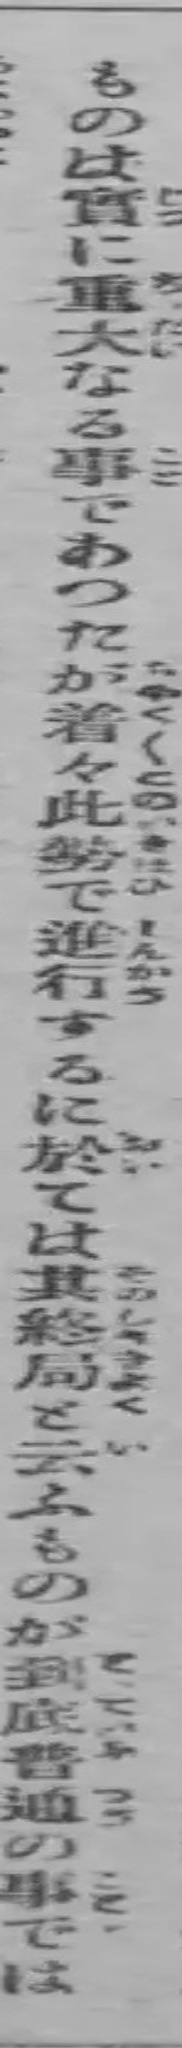ものは実に重大なる事であつたが着々此勢で進行するに於ては其終局と云ふものが到底普通の事では
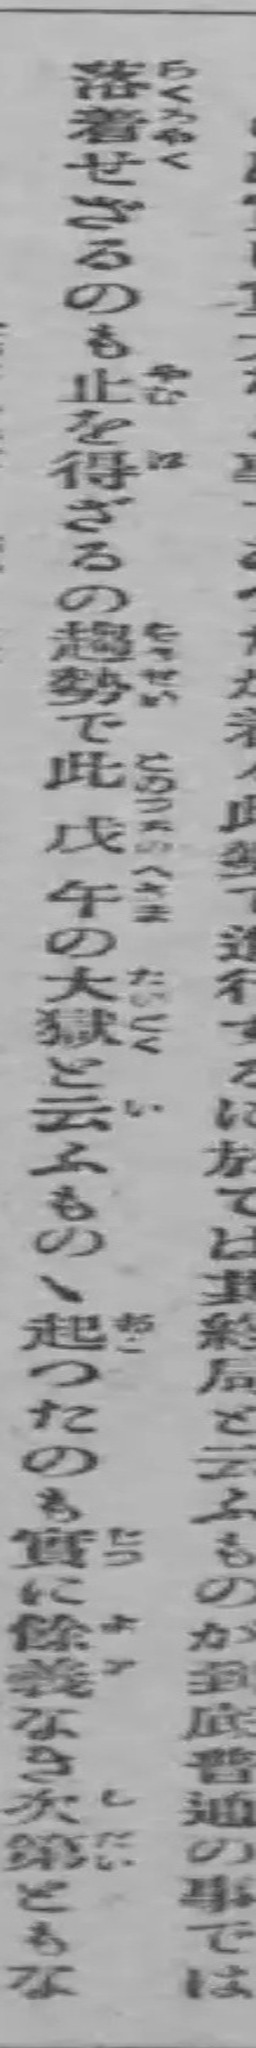落着せざるのも止を得ざるの趨勢で此戊午の大獄と云ふものゝ起つたのも実に余儀なき次第ともな
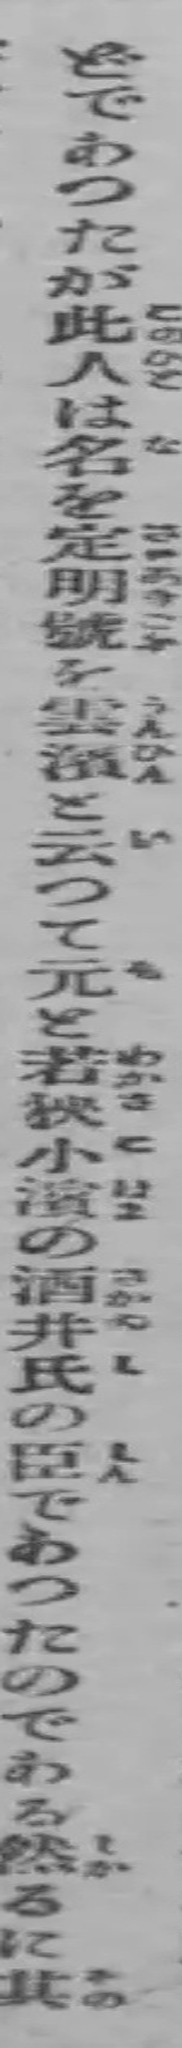どであつたが此人は名を定明号を雲浜と云つて元と若狭小浜の酒井氏の臣であつたのである然るに其
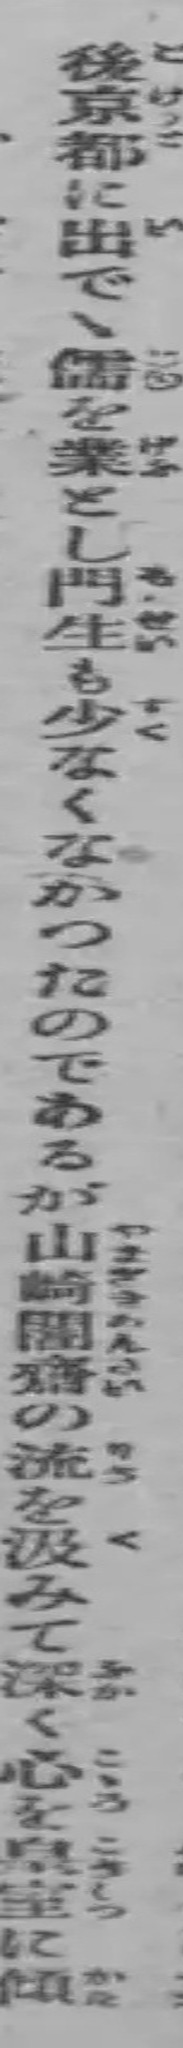後京都に出でゝ儒を業とし門生も少なくなかつたのであるが山崎闇斎の流を汲みて深く心を皇室に傾
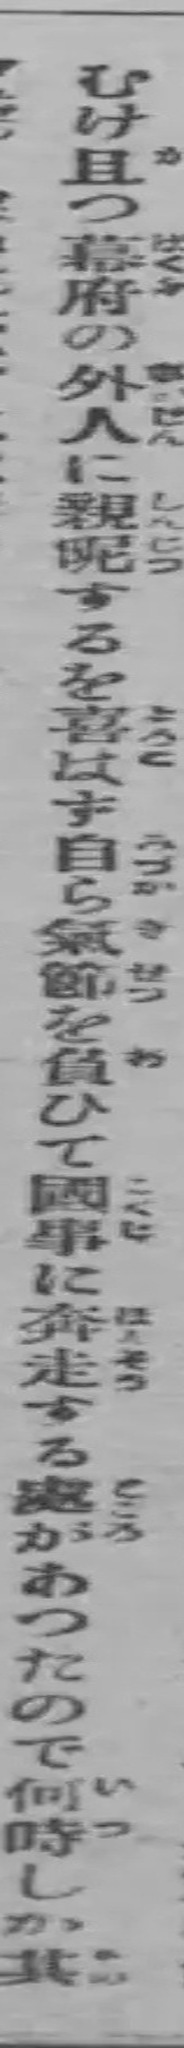むけ且つ幕府の外人に親昵するを喜ばず自ら気節を負ひて国事に奔走する処があつたので何時しか其
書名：豊橋市史談
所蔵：国立国会図書館 National Diet Library, JAPAN
